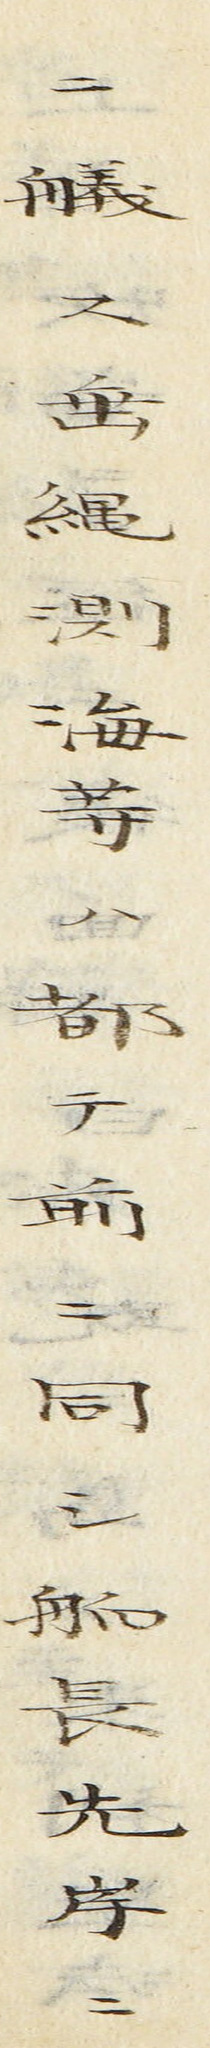ニ艤ス垂縄測海等ハ都テ前ニ同シ舶長先岸ニ

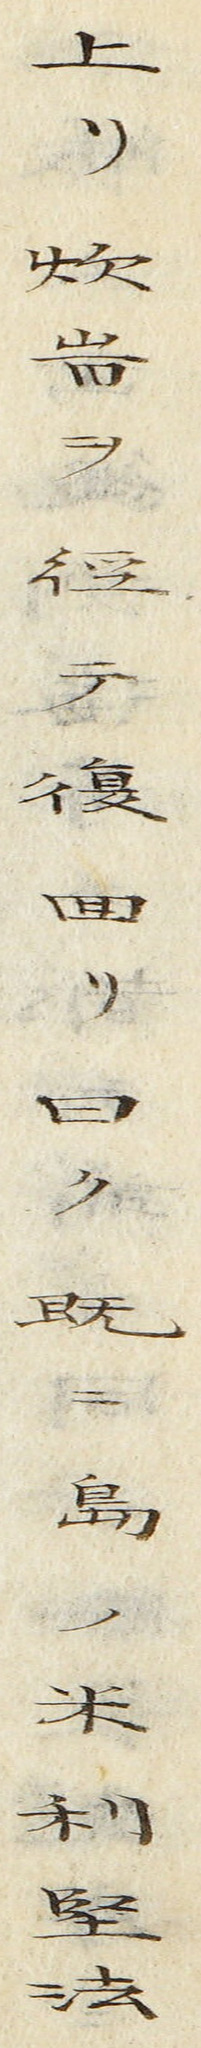上リ炊旹ヲ径テ復回リ曰ク既ニ島ノ米利堅法
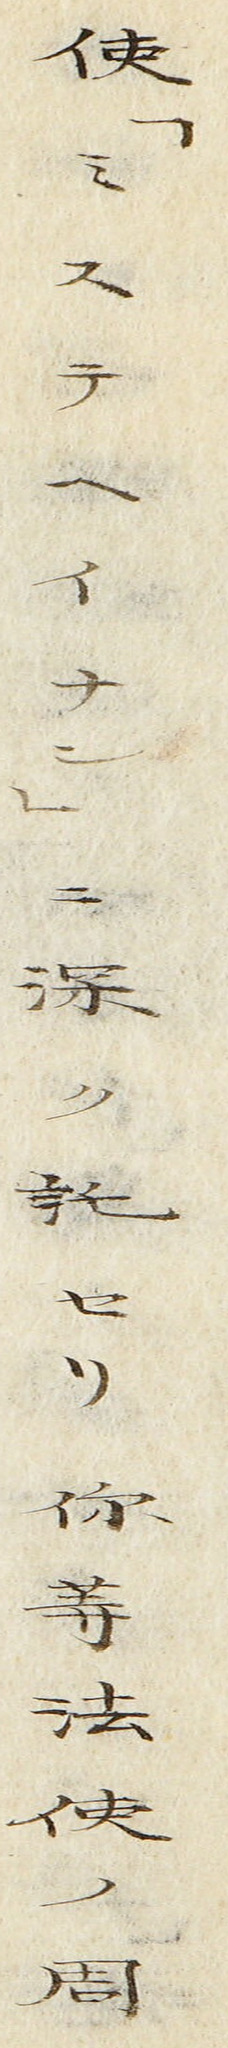使「ミステヘイナン」ニ深ク託セリ你等法使ノ周
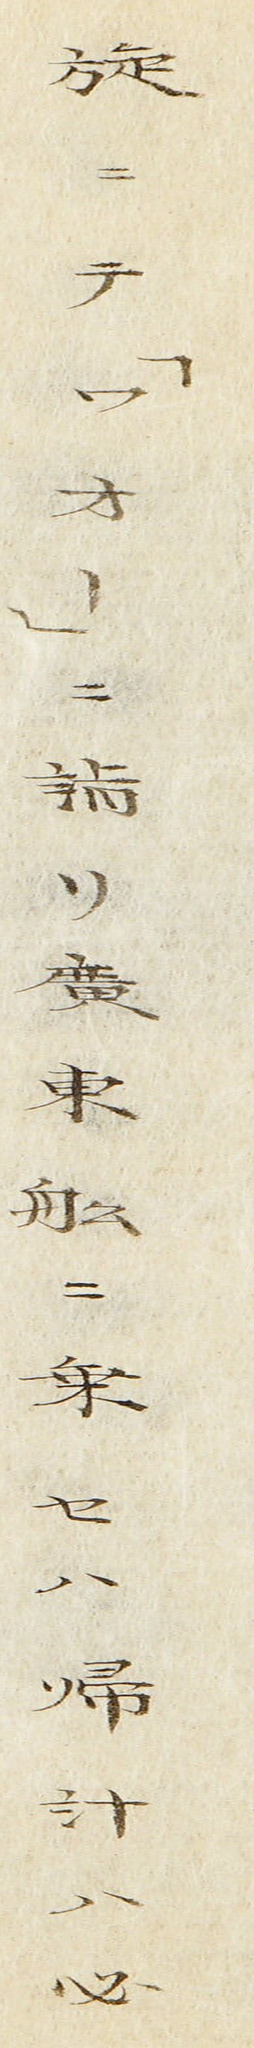旋ニテ「ワオー」ニ詣リ広東舩ニ乗セハ帰計ハ必
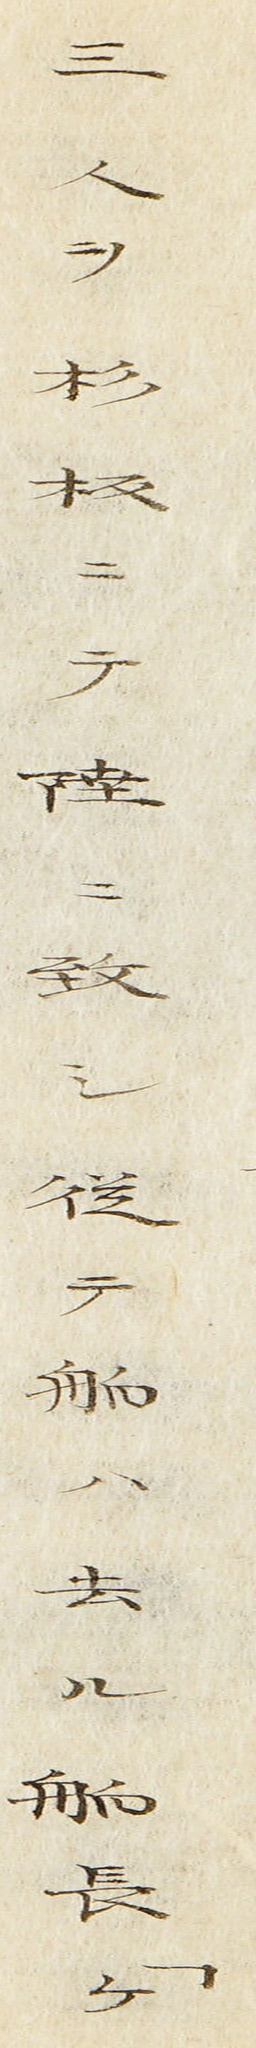三人ヲ杉板ニテ陸ニ致シ従テ舶ハ去ル舶長「ケ
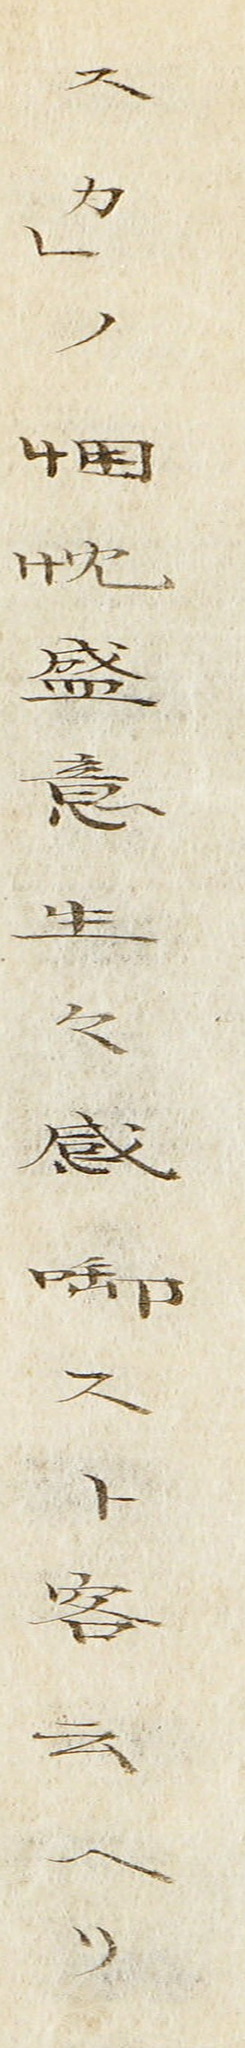スカ」ノ悃忱盛意生々感啣スト客云ヘリ
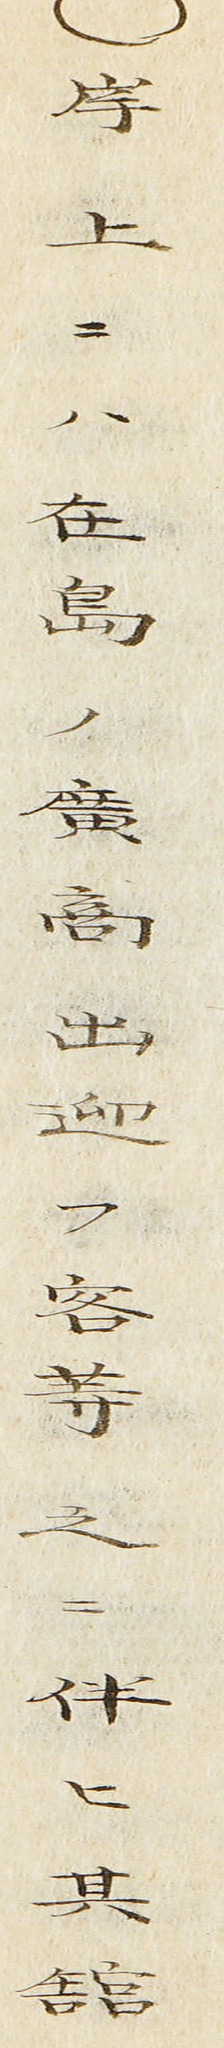○岸上ニハ在島ノ広商出迎フ客等之ニ伴ヒ其館
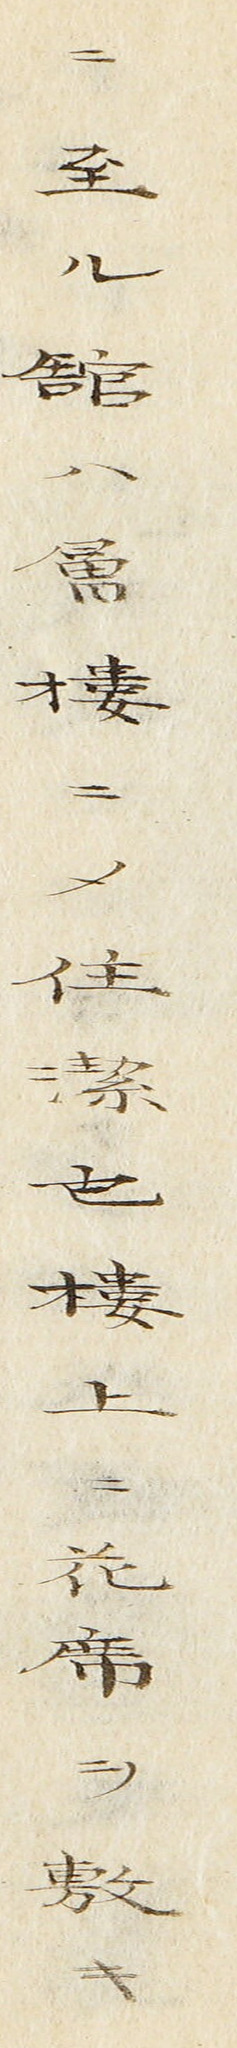ニ至ル館ハ層楼ニシテ住潔也楼上ニ花席ヲ敷キ
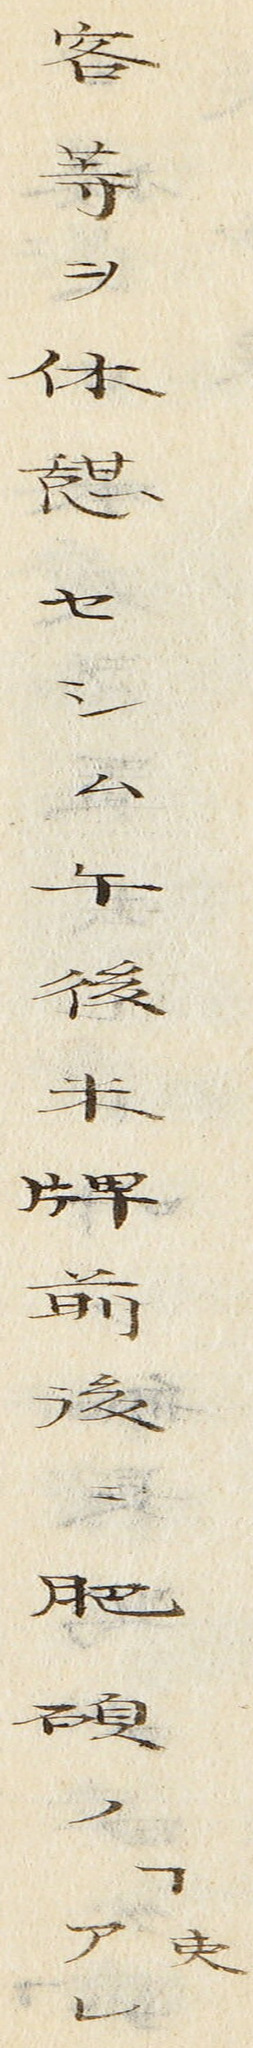客等ヲ休憩セシム午後米牌前後ニ肥碩ノ「アレ
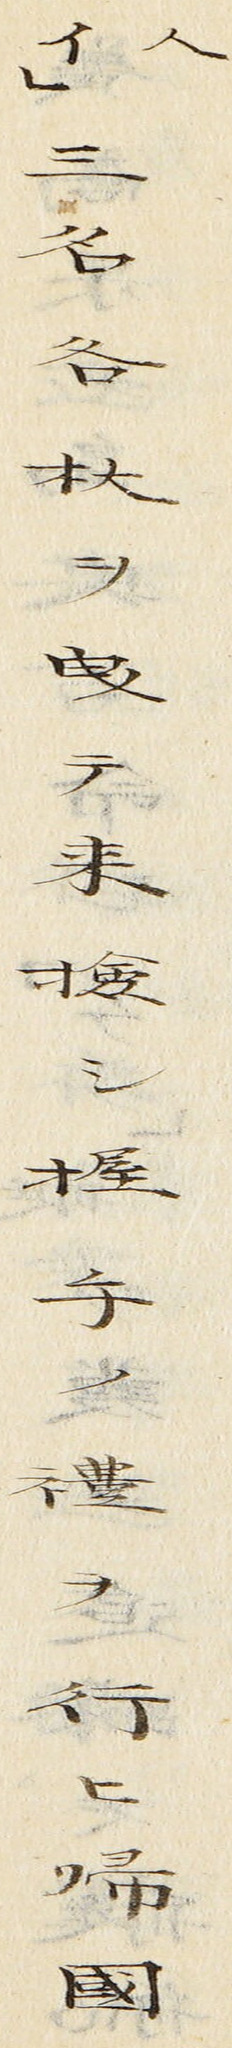イ」三名各杖ヲ曳テ来検シ握手ノ礼ヲ行ヒ帰国
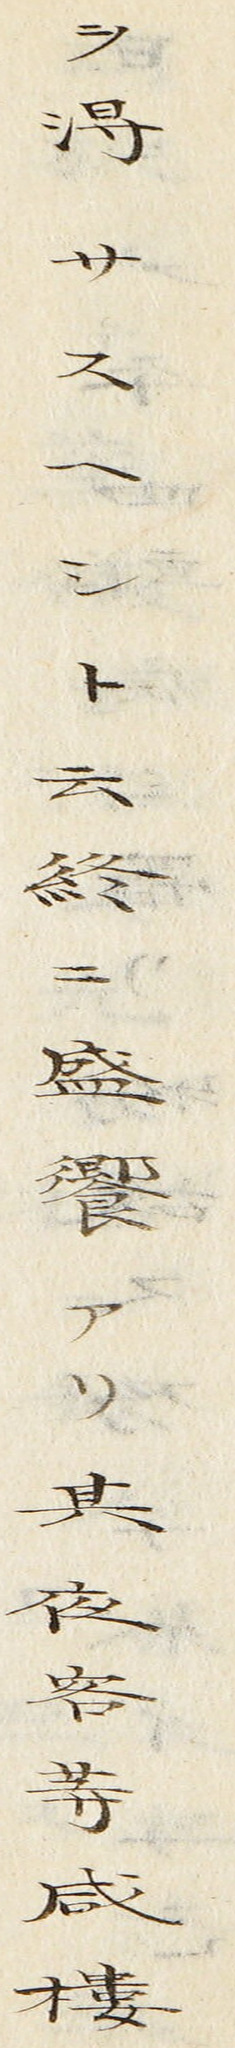ヲ得サスヘシト云終ニ盛饗アリ其夜客等咸楼
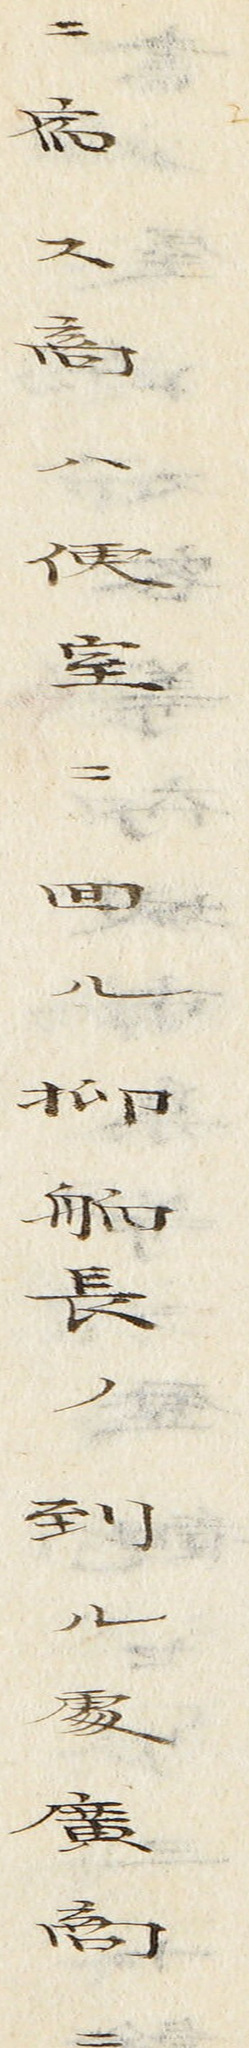ニ宿ス商ハ便室ニ回ル抑舶長ノ到ル処広商ニ
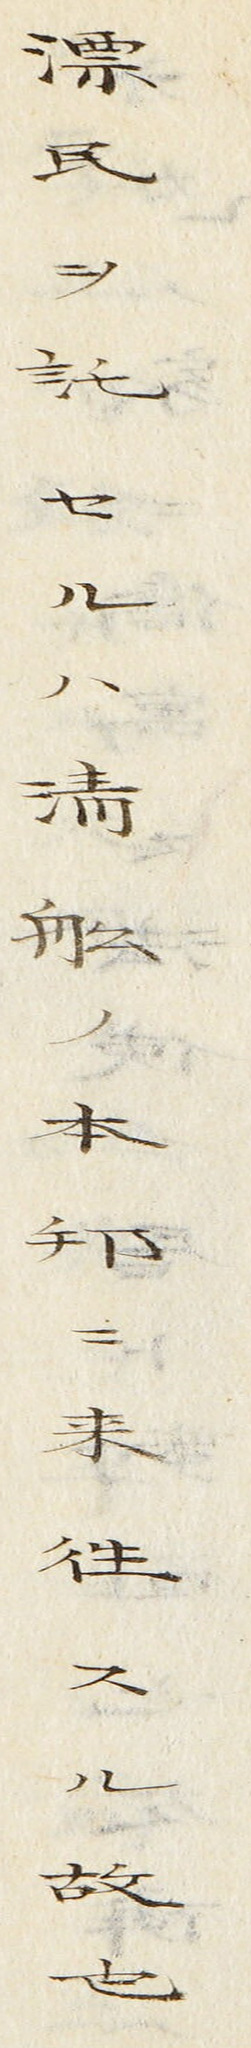漂民ヲ託セルハ清舩ノ本邦ニ来往スル故也
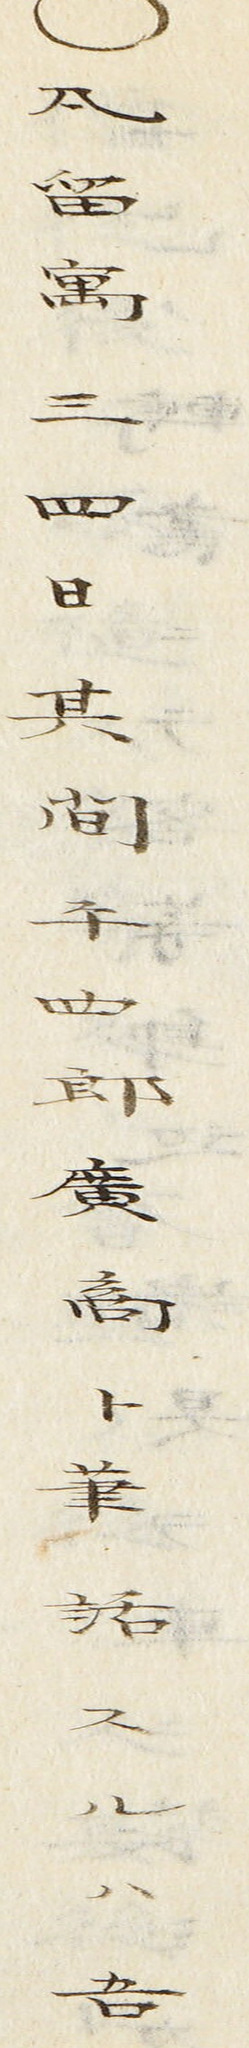○凡留寓三四日其間平四郎広商ト筆話スルハ吾
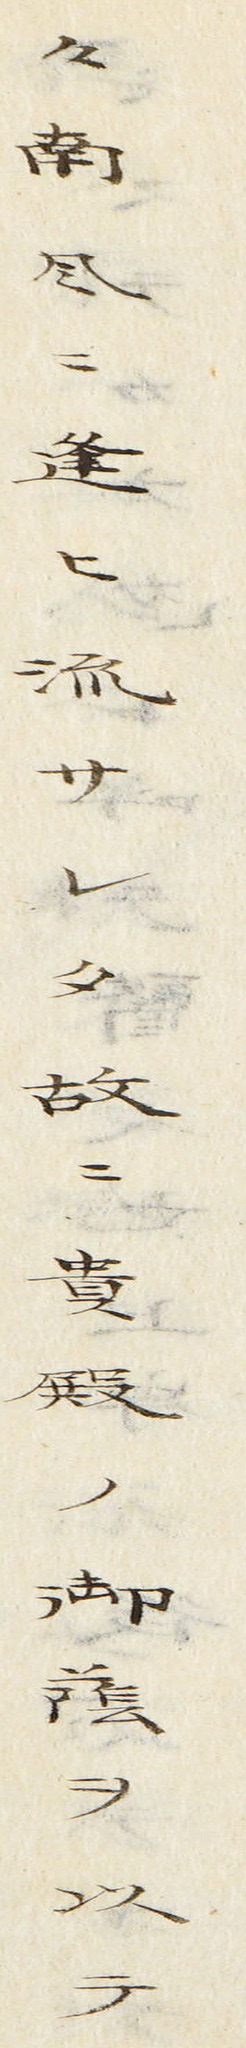々南風ニ逢ヒ流サレタ故ニ貴殿ノ御蔭ヲ以テ
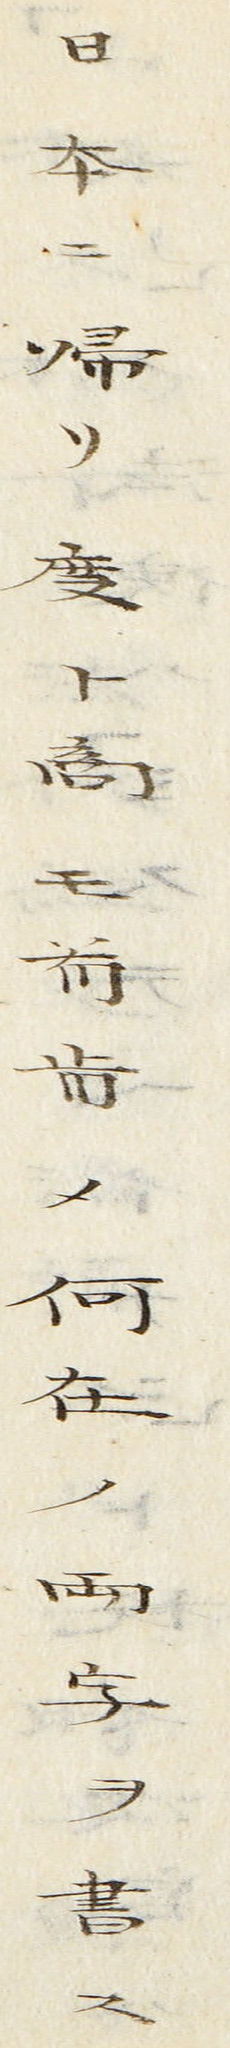日本ニ帰リ度ト商モ首肯シテ何在ノ両字ヲ書ス
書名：蕃談
